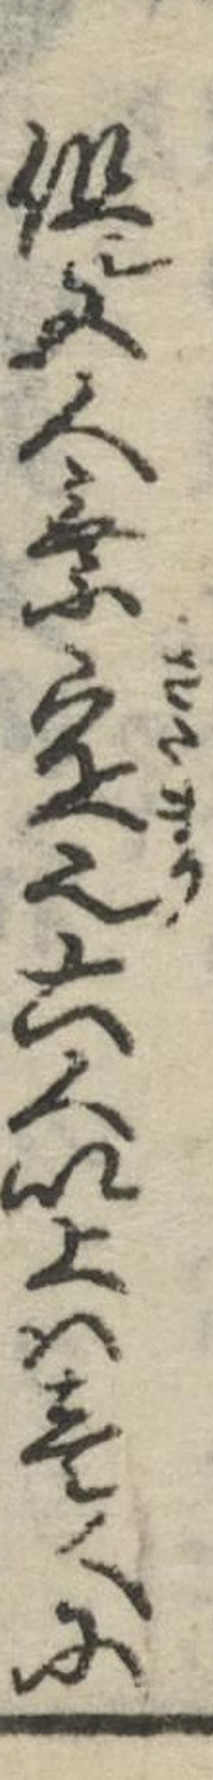但し五人乗定也六人以上は壱人に
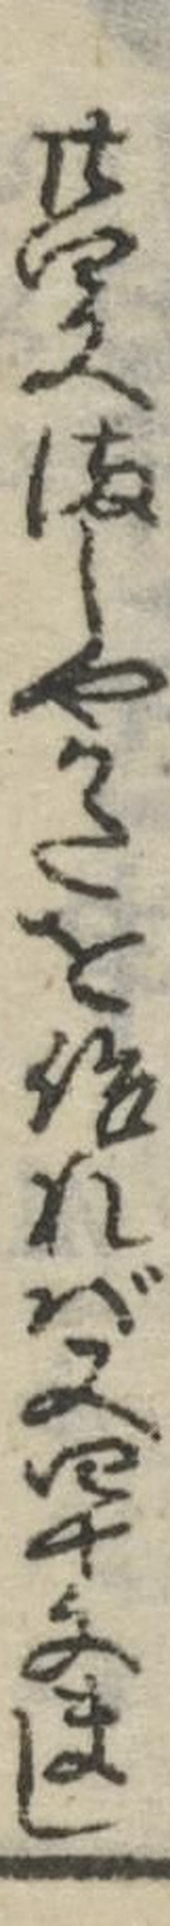廿四文ましやかたを作れば又四十文まし
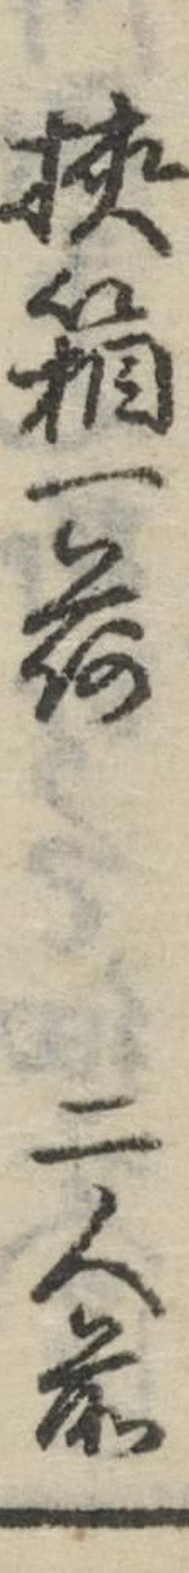挟箱一荷二人前
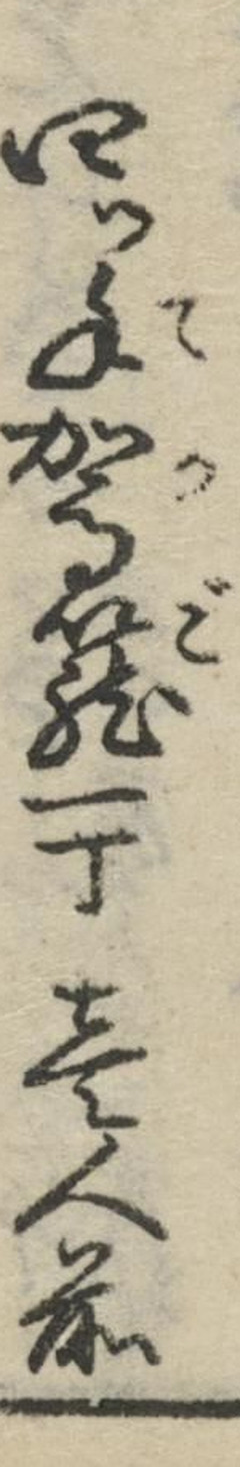四つ手駕籠一丁壱人前
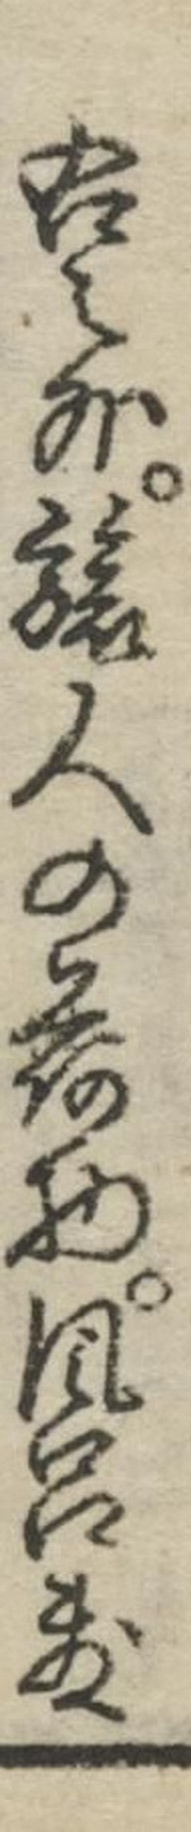右之外。旅人の荷物。風呂敷
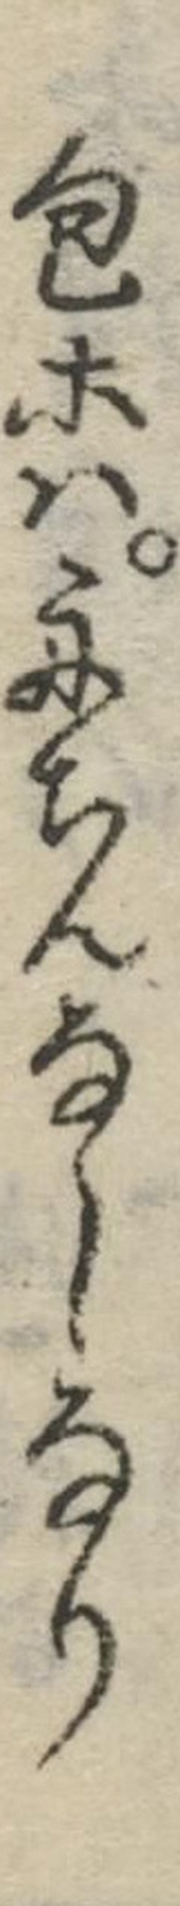包抔は。舟ちんなしなり
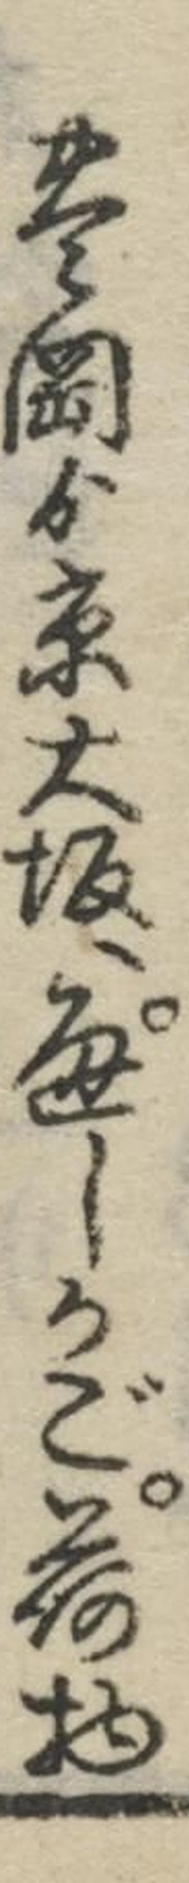豊岡ゟ京大坂へ。通しかご。荷物
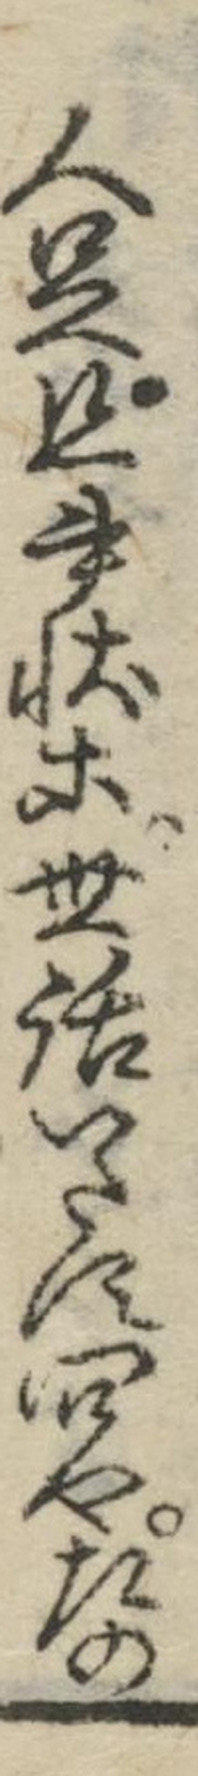人足且書状等世話いたす問や左の
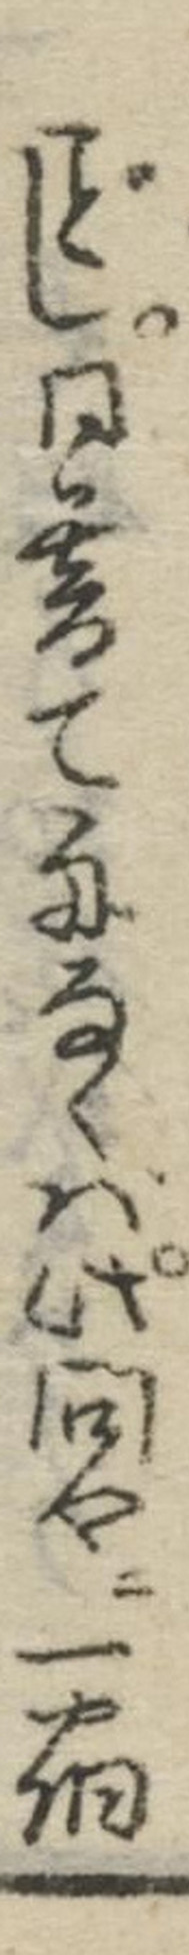ごとし。日暮て舟なくば。此問やに一宿
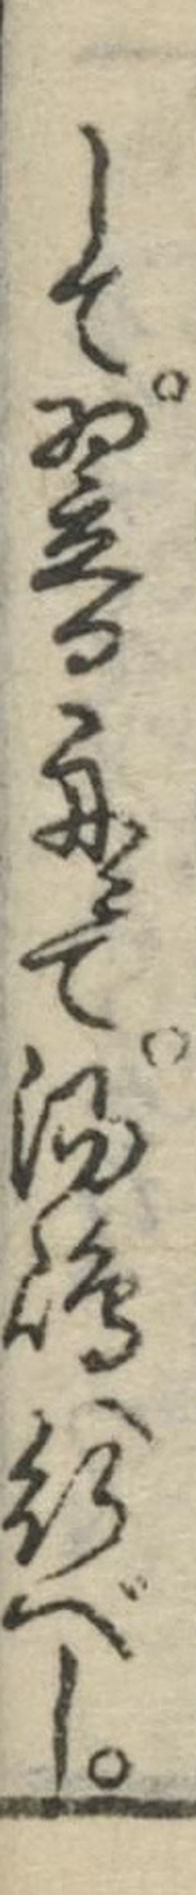して。翌日舟にて。湯嶋へ行べし。
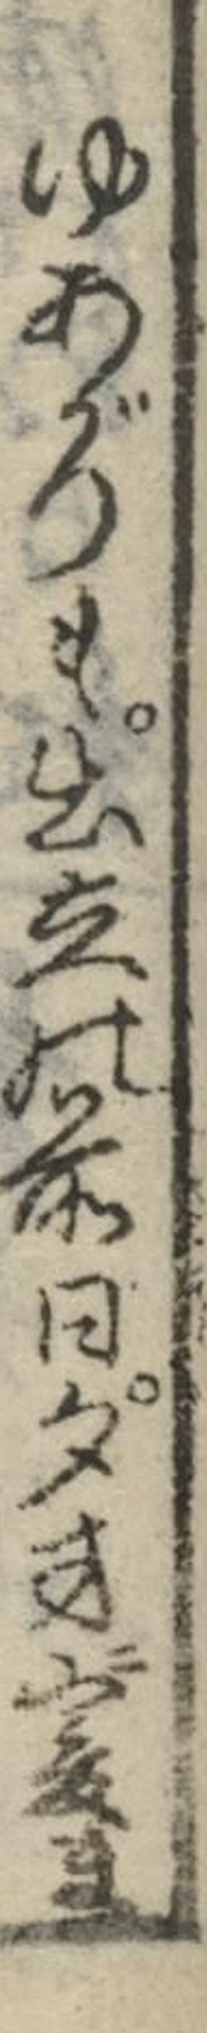ゆあがりも。出立の前日。夕方に爰ま
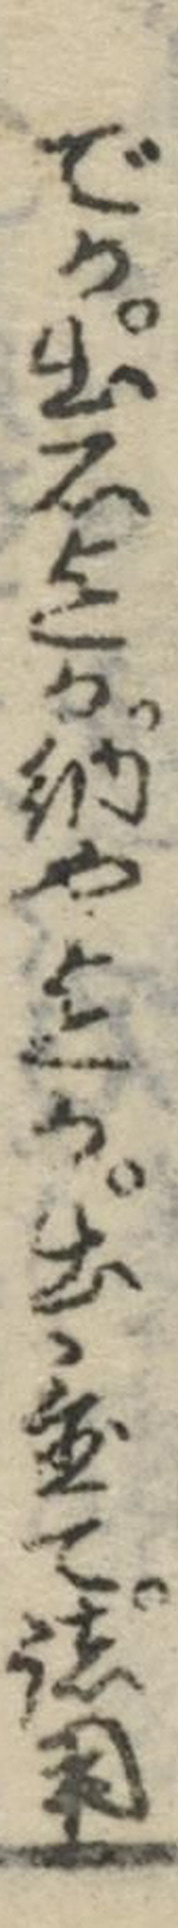でか。出石迄か。納や迄か。出置て。諸用
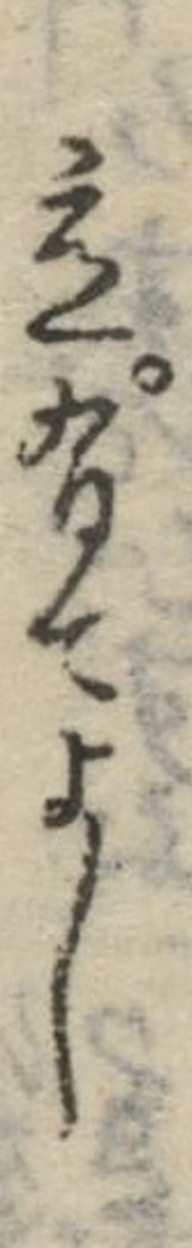意。有てよし
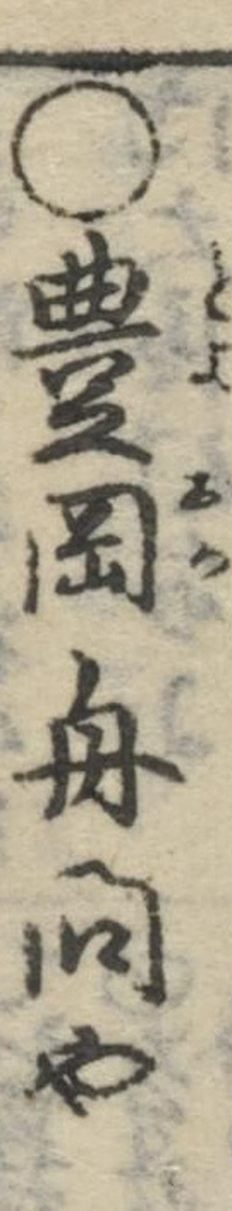○豊岡舟門や
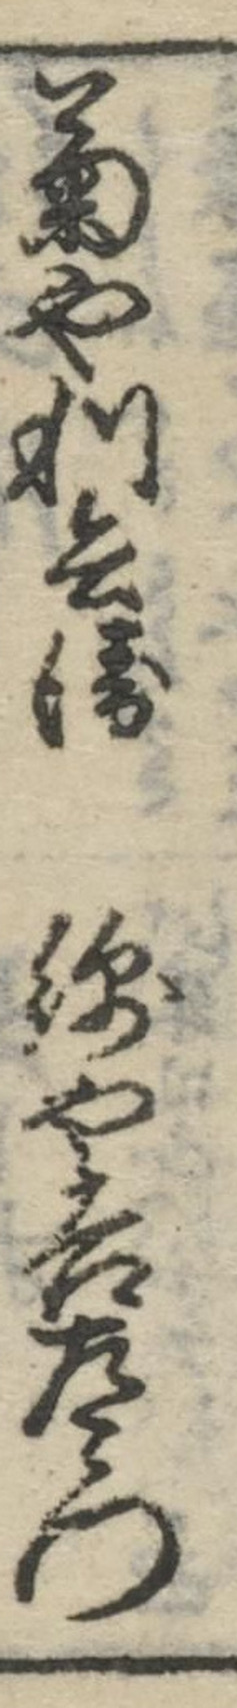菊や利兵衛綿や吉左衛門
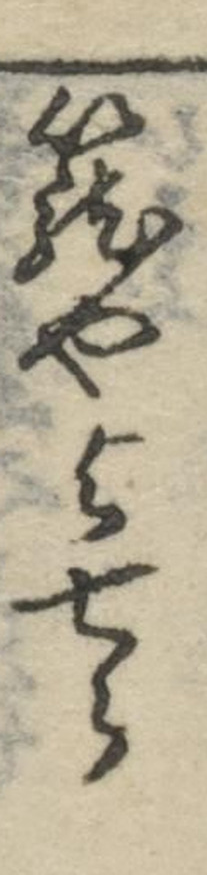籠や与七郎
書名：但州城崎浴湯辧
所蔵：東京大学地震研究所図書室 Earthquake Research Institute Library, The University of Tokyo, JAPAN
